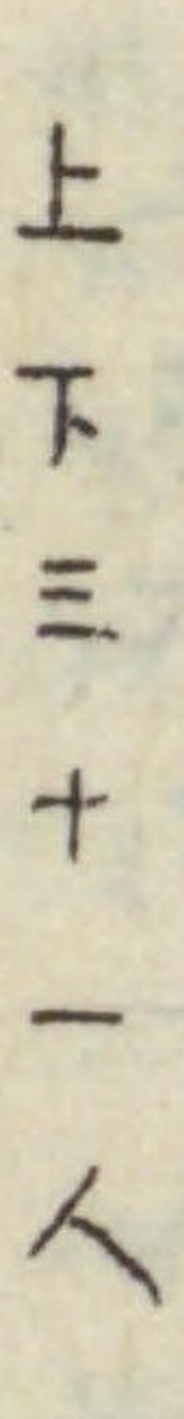上下三十一人
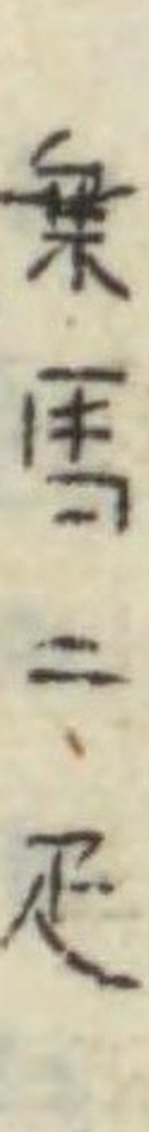乗馬二疋
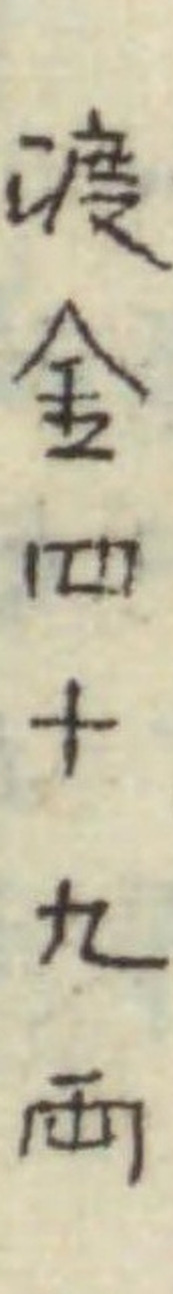千石渡金四十九両
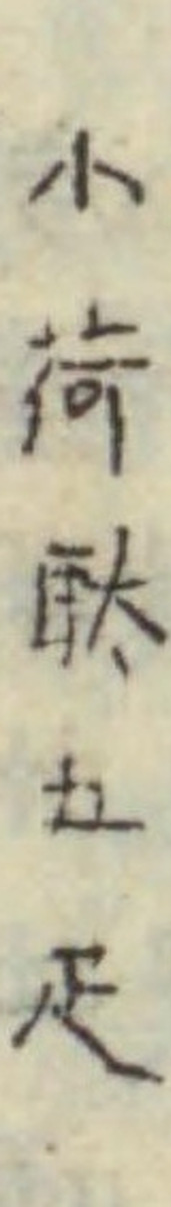小荷駄五疋
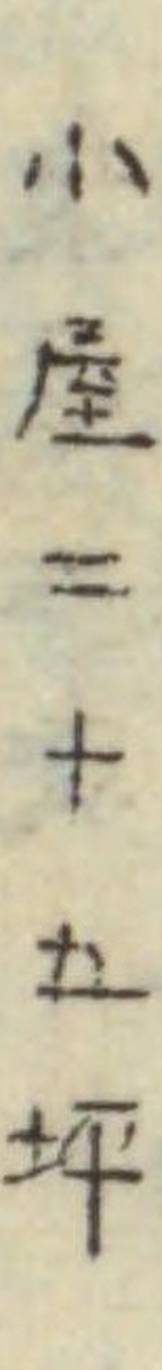小屋二十坪
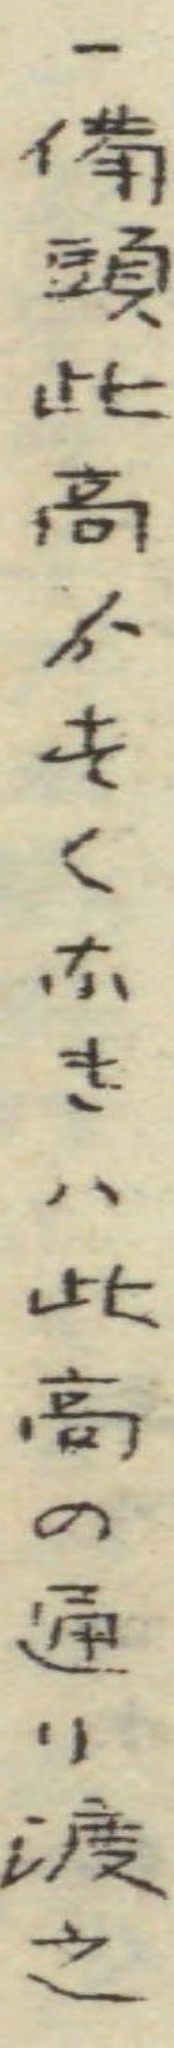一備頭此高ゟすくなきハ此高の通り渡之

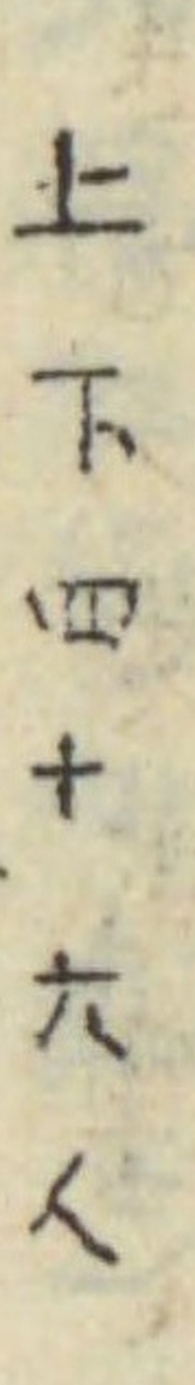上下四十六人
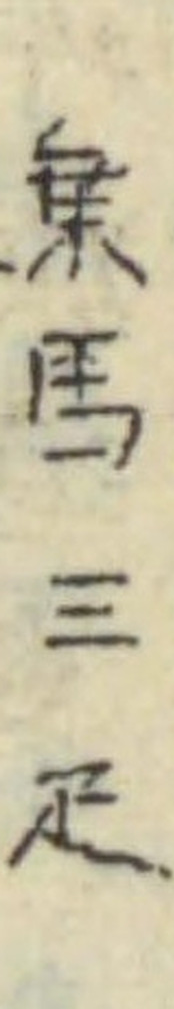乗馬三疋
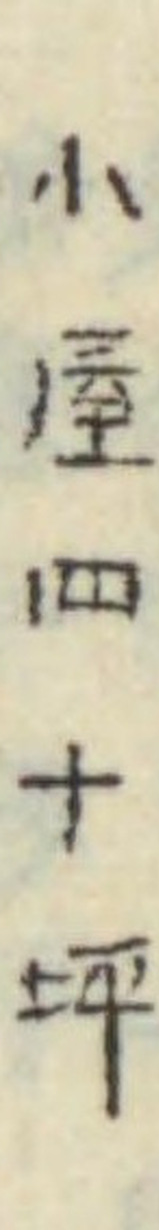小屋四十坪
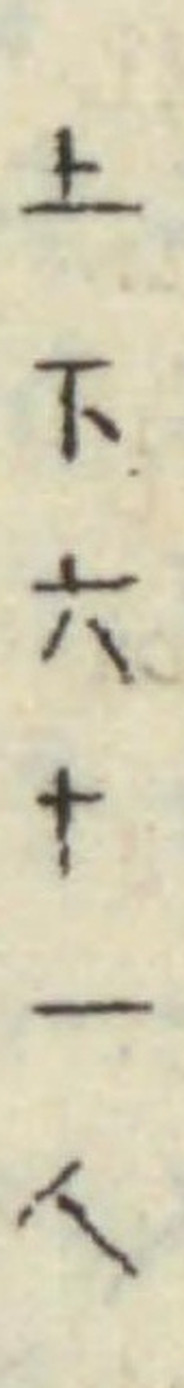上下六十一人
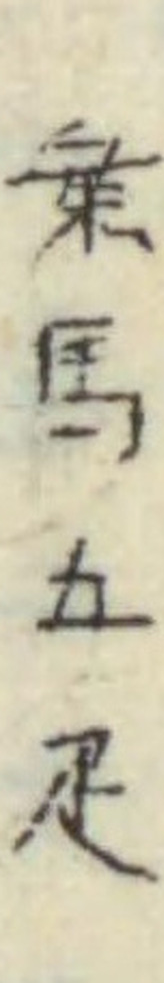乗馬五疋
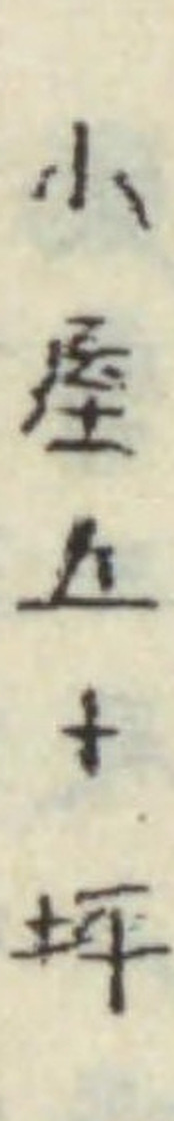小屋五十坪
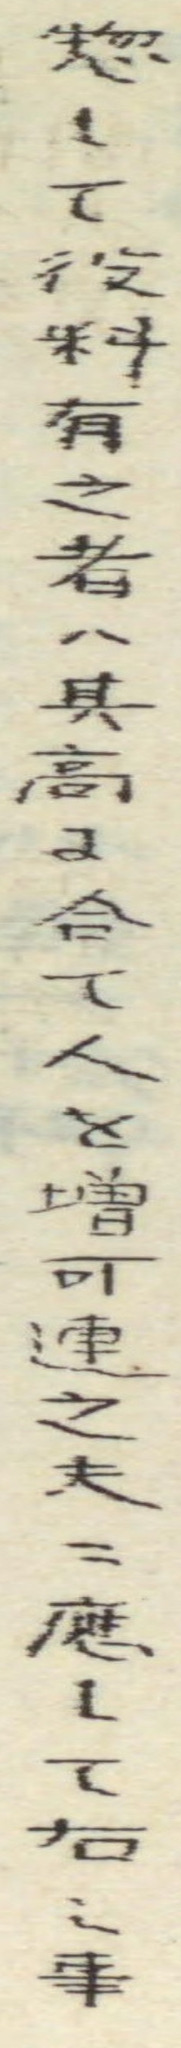惣して役料有之者ハ其高に合て人を増可連之夫二応して右之事
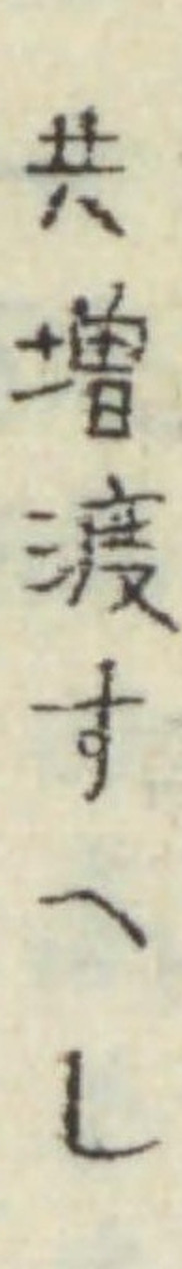共増渡すへし
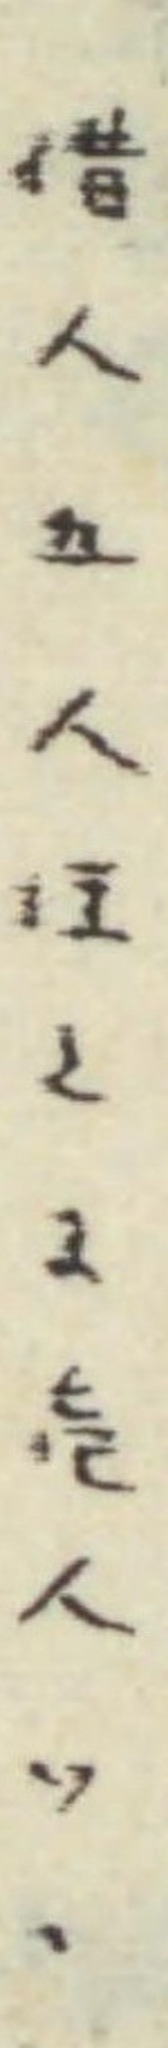借人五人ほとに壱人ツゝ
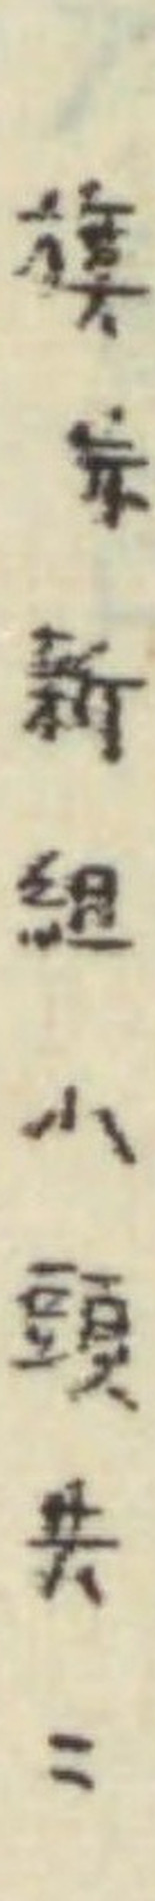旗并新組ハ頭共二
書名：三河吉田藩動員史料
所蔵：国立国会図書館 National Diet Library, JAPAN
